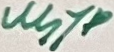щур
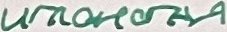иглоногая
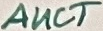аист
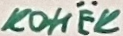конёк
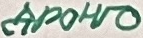дронго
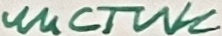чистик
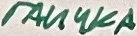гаичка
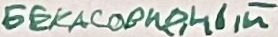бекасовидный
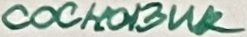сосновик
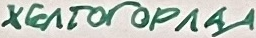желтогорлая
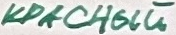красный
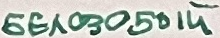белозобый
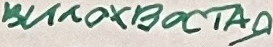вилохвостая
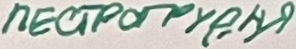пестрогрудая
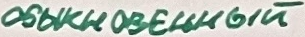обыкновенный
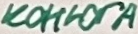конюга
